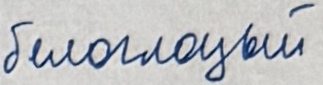белоглазый
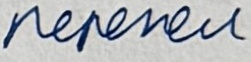перепел
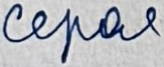серая
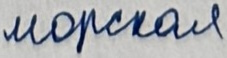морская
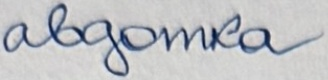авдотка
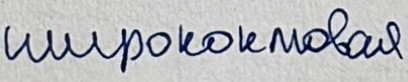ширококлювая
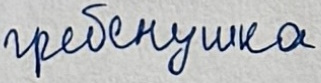гребенушка
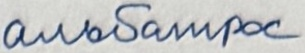альбатрос
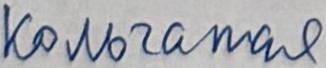кольчатая
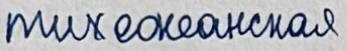тихеокеанская
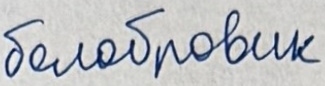белобровик
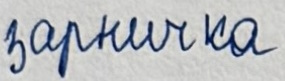зарничка
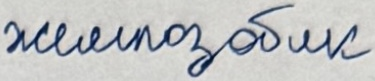желтозобик
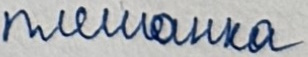плешанка
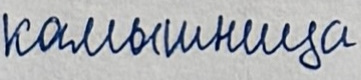камышница
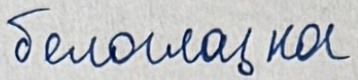белоглазка
